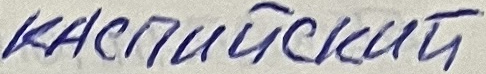каспийский
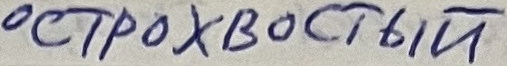острохвостый
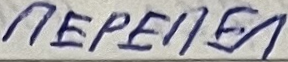перепел
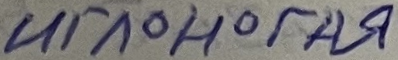иглоногая
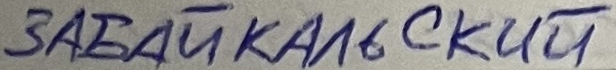забайкальский
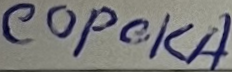сорока
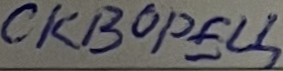скворец
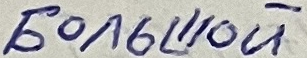большой
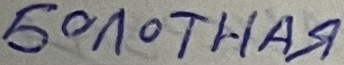болотная
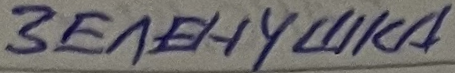зеленушка
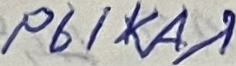рыжая
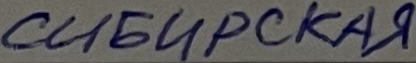сибирская
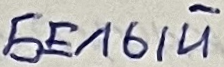белый
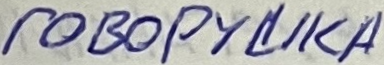говорушка
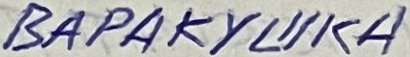варакушка
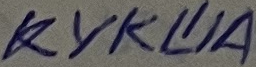кукша
